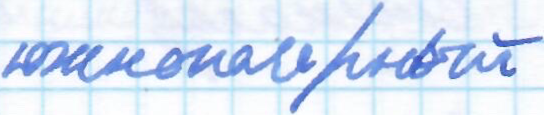южнополярный
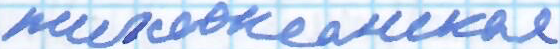тихоокеанская
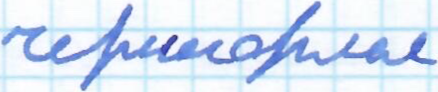черногорлая
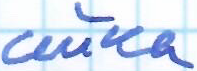сойка
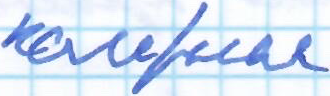полярная
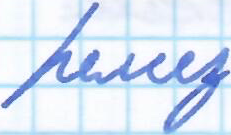ремез
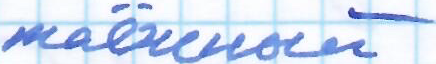таёжный
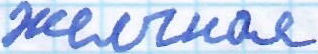желчная
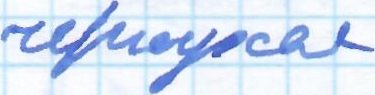черноухая
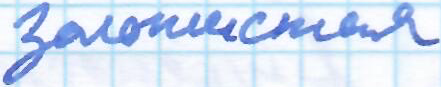золотистая
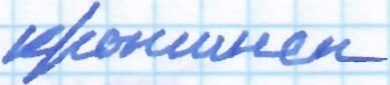кроншнеп
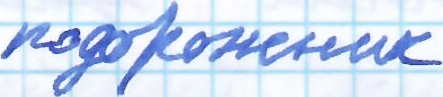подорожник
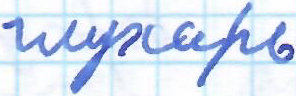глухарь
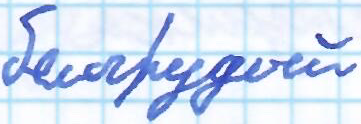белогрудый
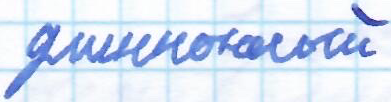длинноносый
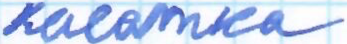касатка
